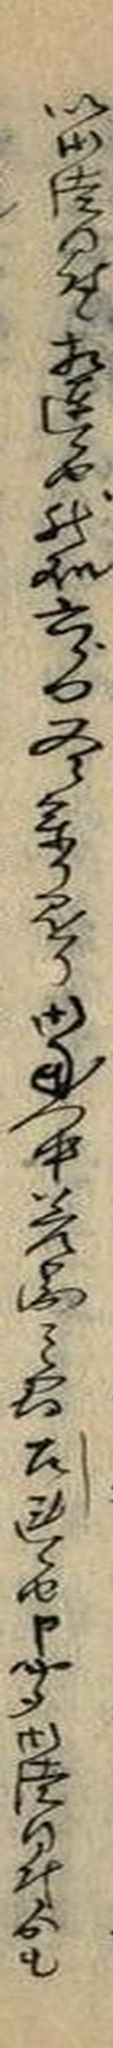以御徒目付へ相達候由然処六郎右衛門又々参り懸り御用人中差図之に候間召連候由申聞御徒目付ゟも
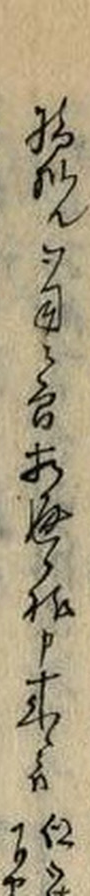指掛ル御用に候間相通候様申来候に付
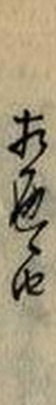相通候由
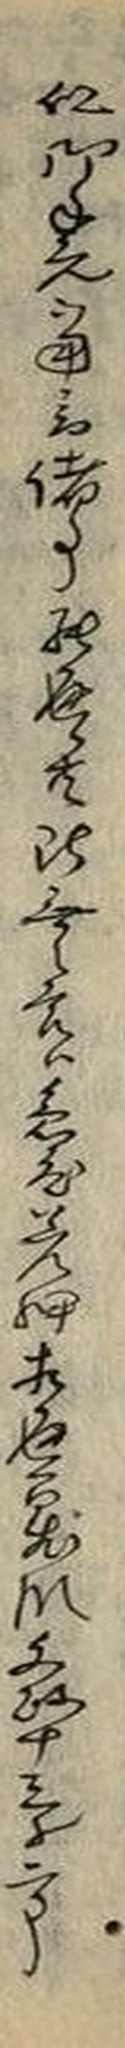但御手元御用二而諸事罷通候共断無之節は急度差押相通間敷候段文政十三寅二月
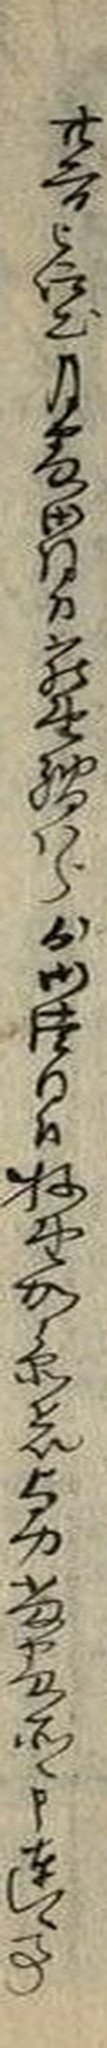廿二日被仰出月番御目付荻野鍋八郎ゟ御徒目付牧野加兵衛を以与力当番所へ申達候事
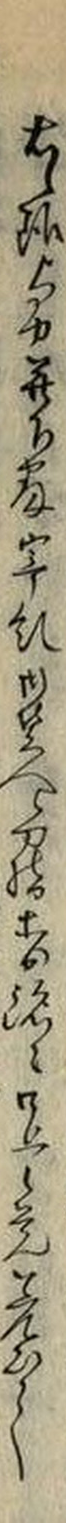右之趣与力并下番宰領御貸人へ刀指等ゟ銘々口上之覚差出之
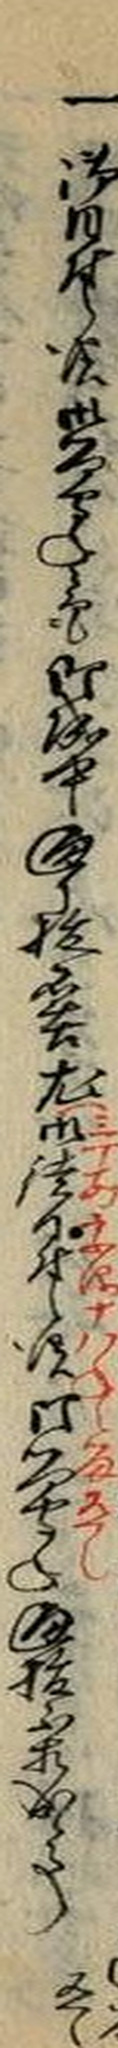一御目付之儀御留守年に而も御城中通抜不苦尤御徒目付之儀は御留守年通抜不相成候事
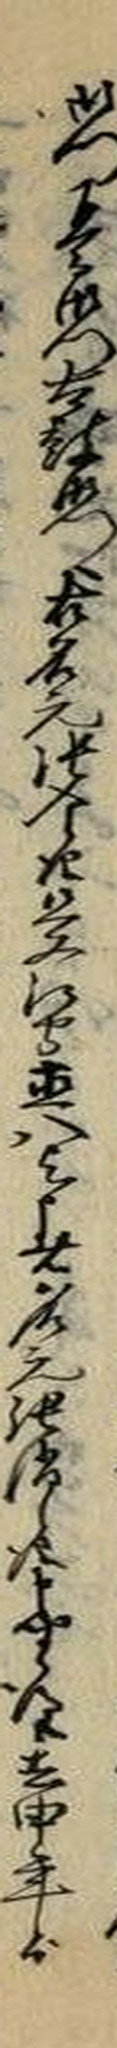御門下馬御門太鼓御門へ右名元張入之儀且又江守直八と申者名元張消候儀申聞候得共去申年ゟ
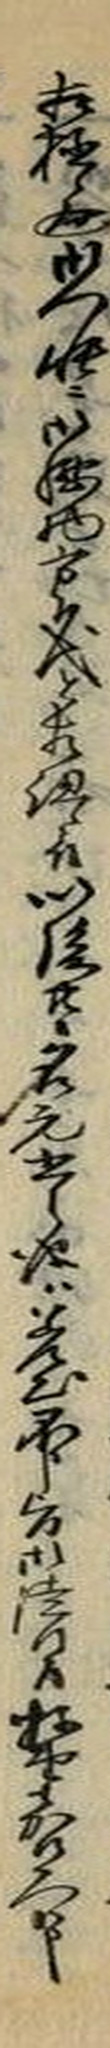相極候通御門帳に御腰物方下代と相認候に付以後共に名元書之儀は差出不申旨御徒目付松野嘉左衛門申
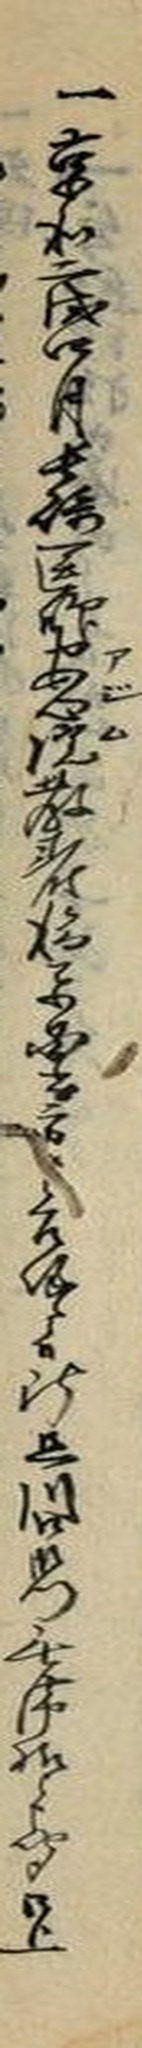一享和二戌四月長崎医師安心院教寿稻葉図書方に召呼候に付断且川口御門無滞様申聞候口上
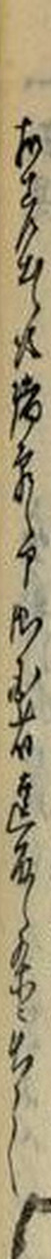控差出候儀諸願之部御国者達留之条に出之
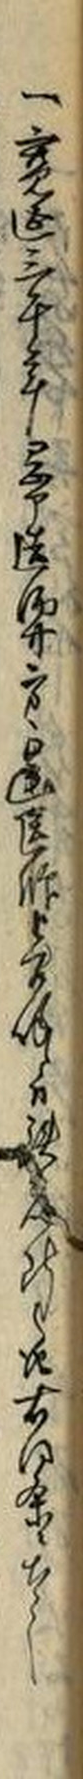一寛延三午年岡部造酒介方へ歯医師被召呼候に付鉄御門断之儀右同条に出之
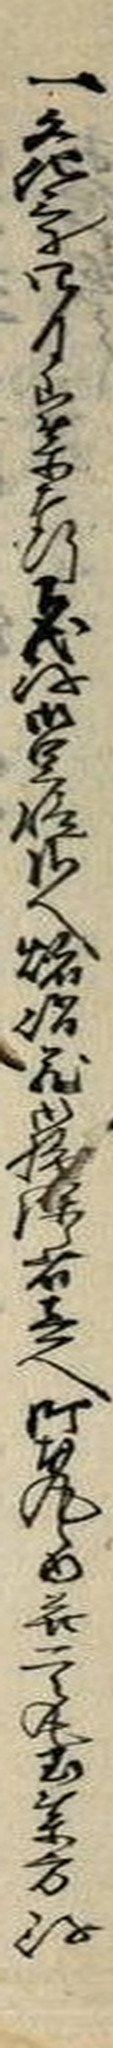一文化寅四月玉薬奉行下代役御足軽弐人焔硝蔵御掃除之者壱人御本丸之内并二之丸玉薬方役
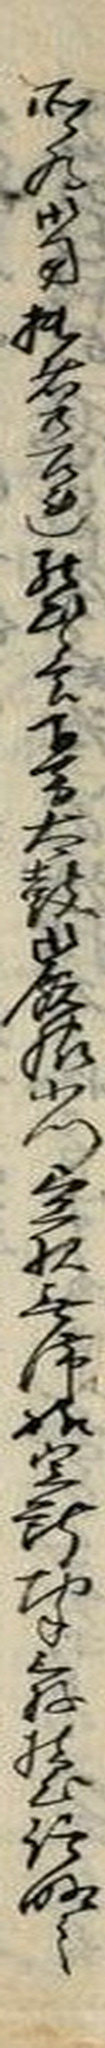所へ為御用拙者共召連罷出候節下馬太鼓御厩脇小門昼夜無滞候様定所切手三枚指出跡略之
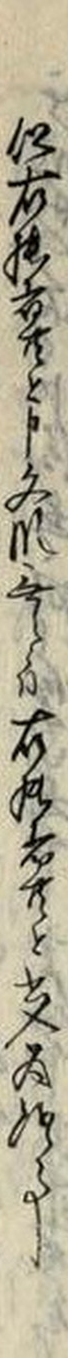但右拙者共と申文段無之に付右拙者共と書入為致候事
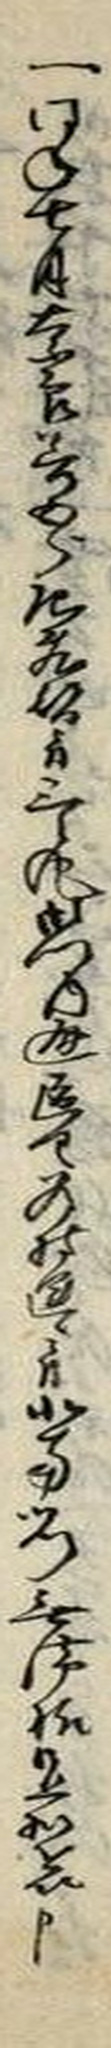一同年七月奈良善五郎屋敷替に付三之丸御門内通道具為持運候に付北南御門無滞候様口上扣を以申
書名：御門御櫓之部
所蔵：福井県文書館 Fukui Prefectural Archives
